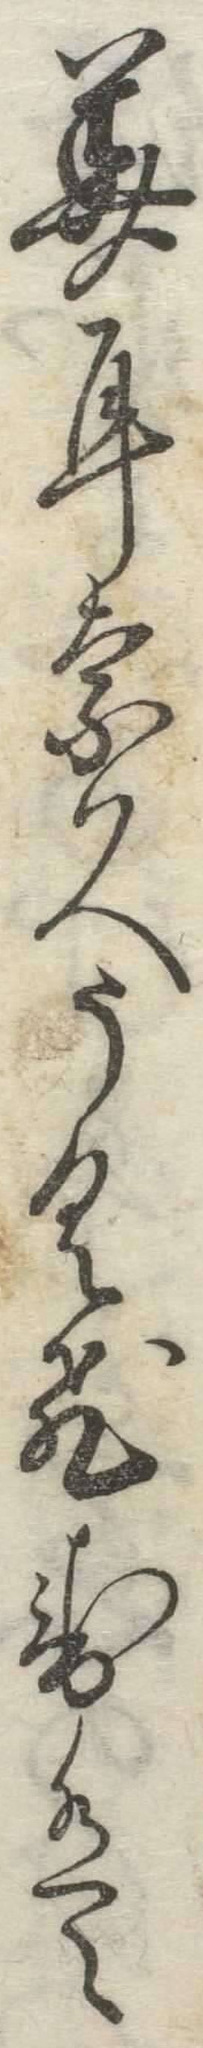華になくうくひすは
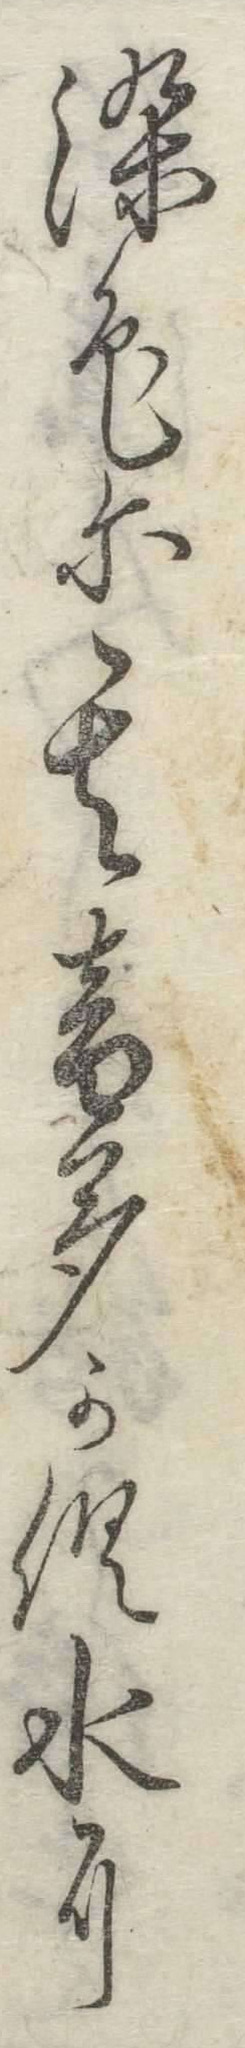染色に其音たかく水に
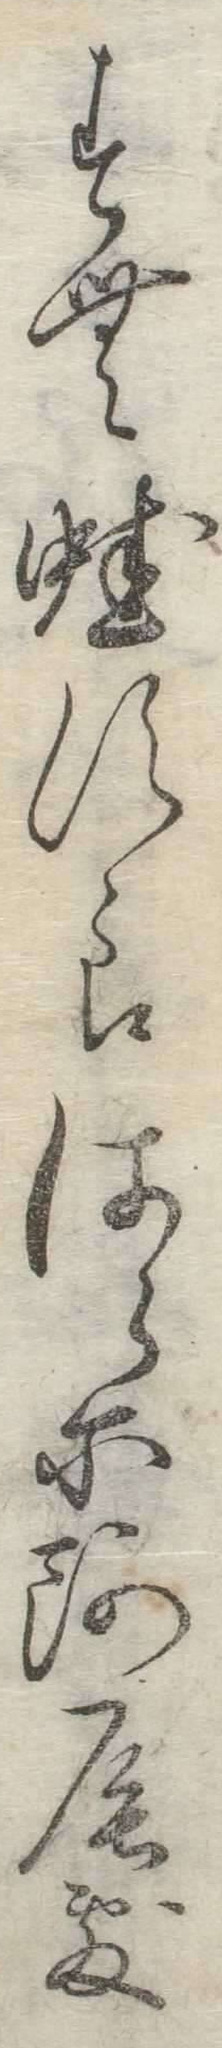すむ蛙すらはらにあや敷
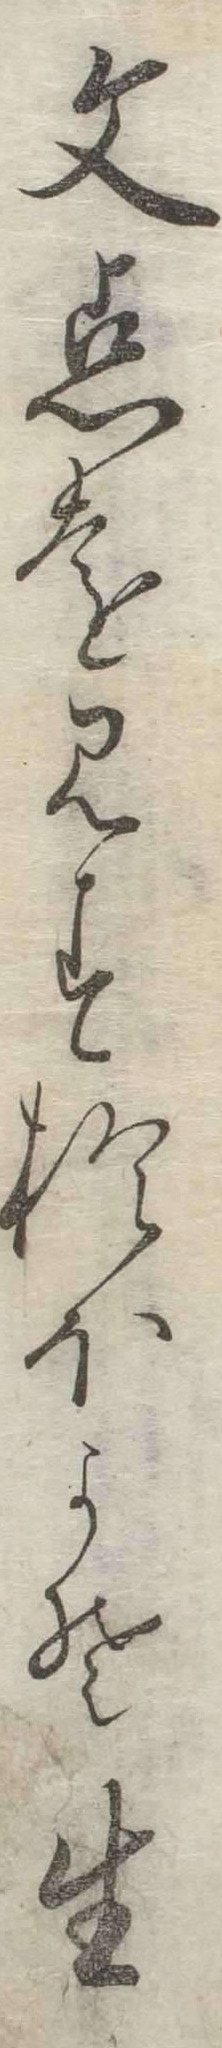文点を見すおほよそ生
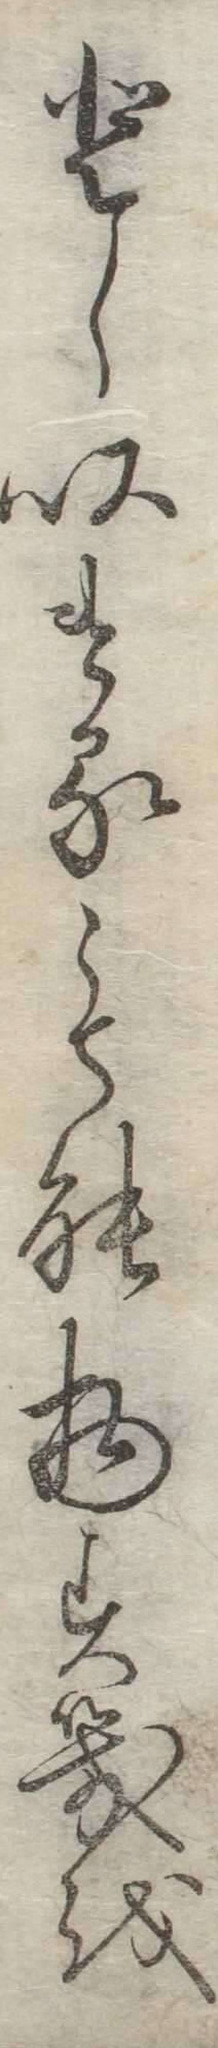としいけるもの物すきを

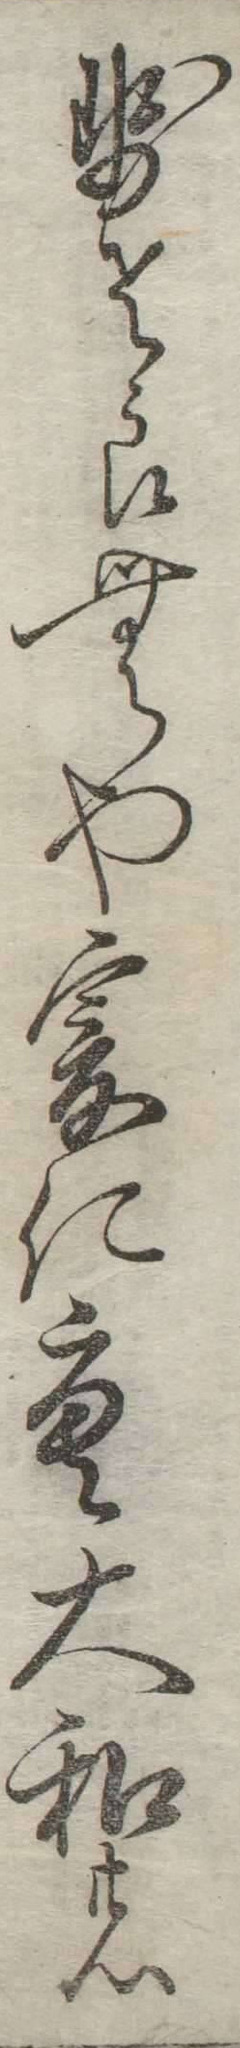せさらむや爰に唐大和の
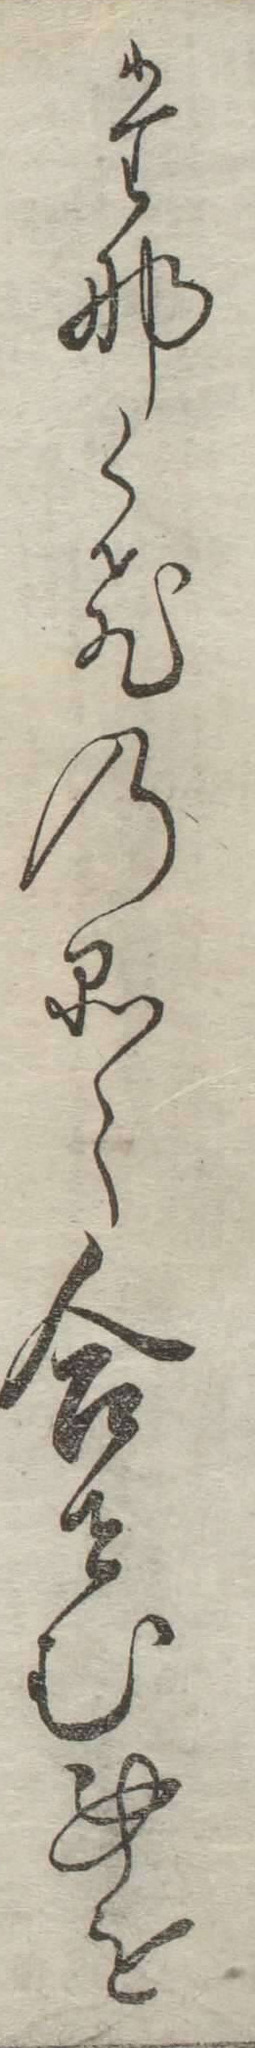たなくひの品々合せむ事を
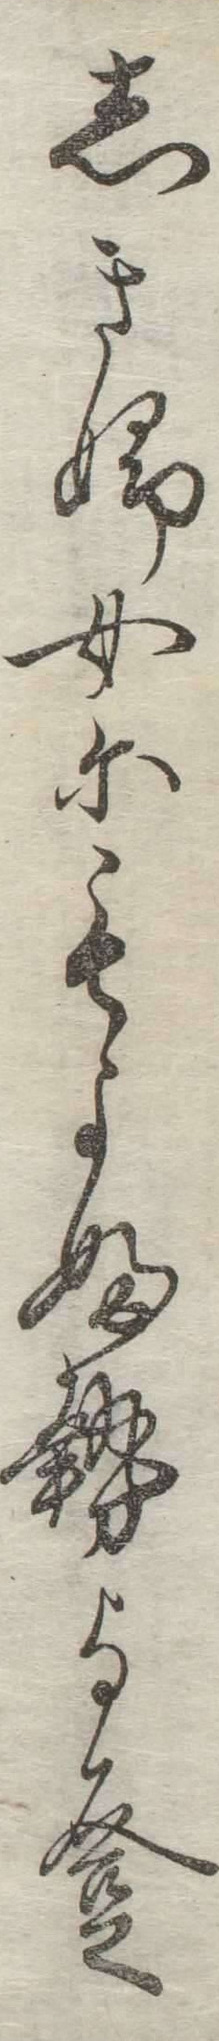しきふ女にもよふせよと
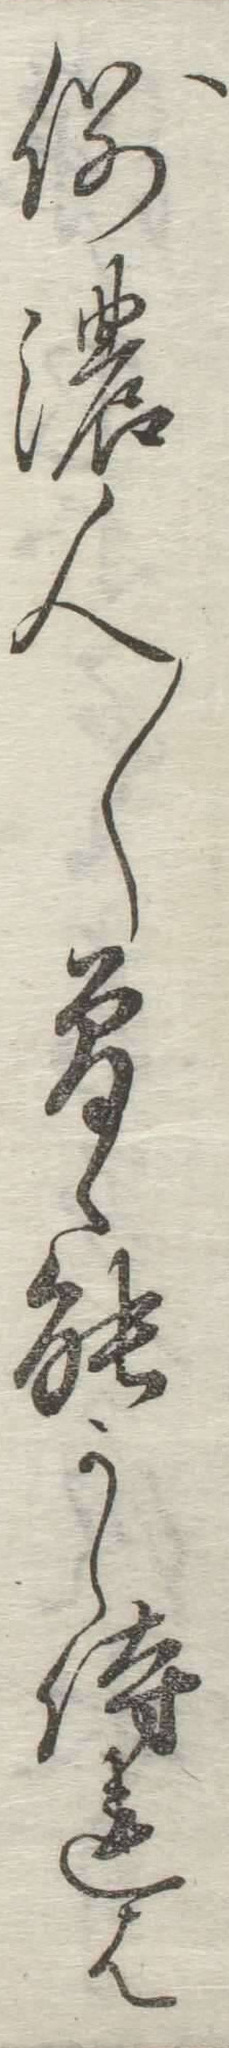側の人〳〵そゝのかし侍れは
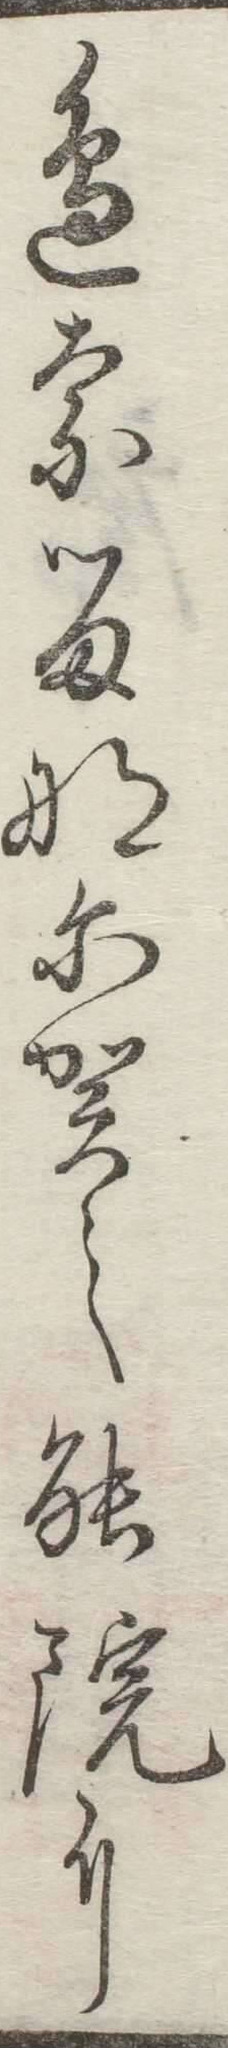辺なるなにかしの院に
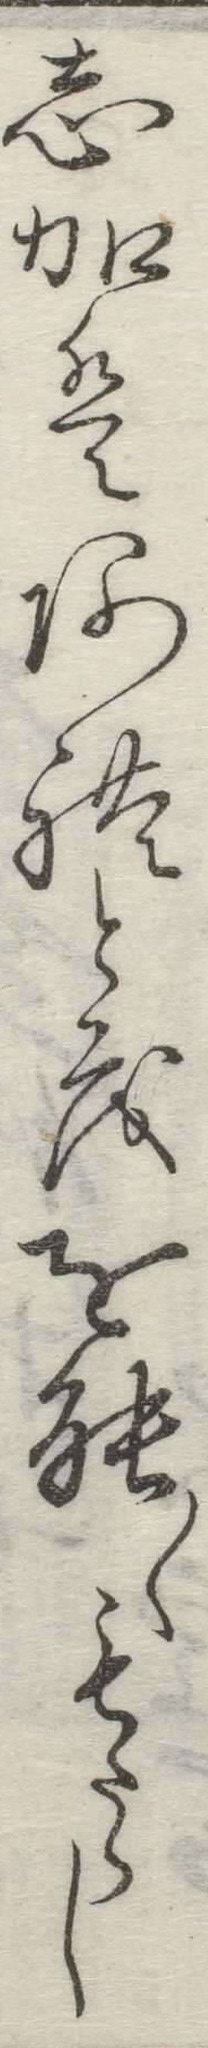しかはあれともをの〳〵もたらし
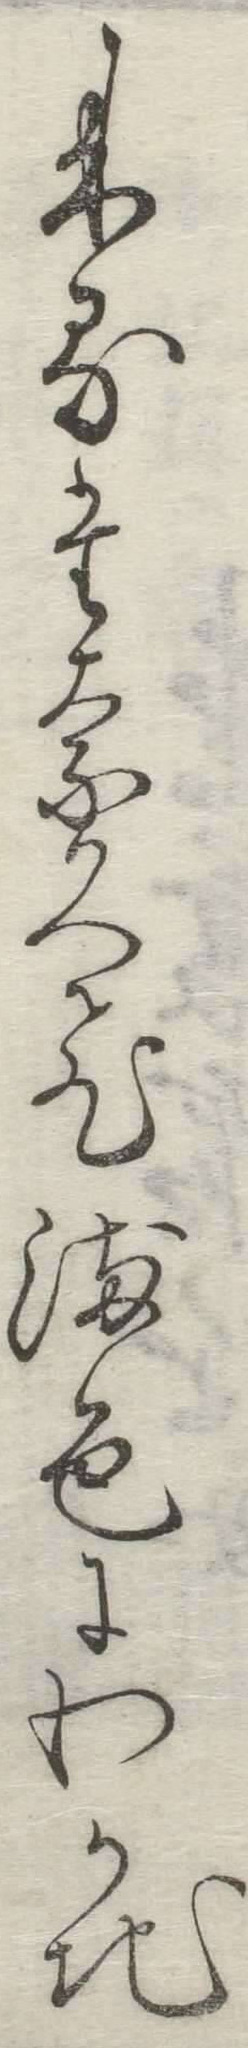来るたなくひ染色にわかち
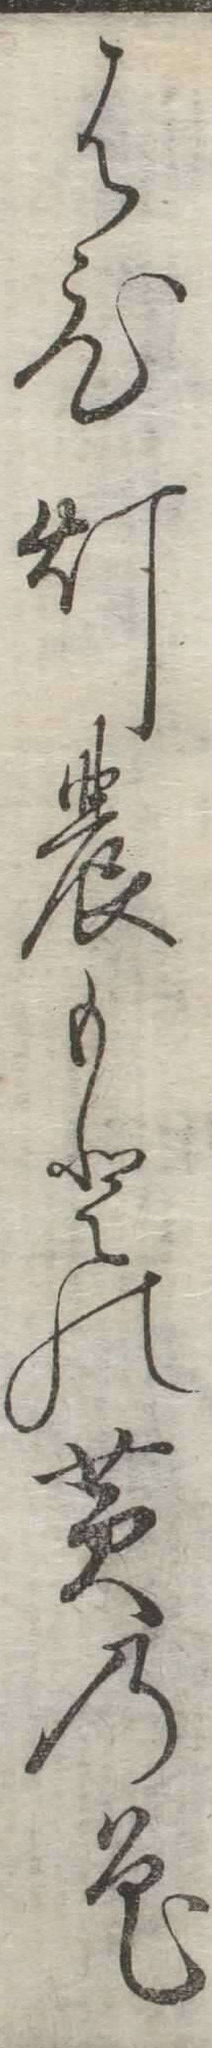はひ灯のもとの黄の色
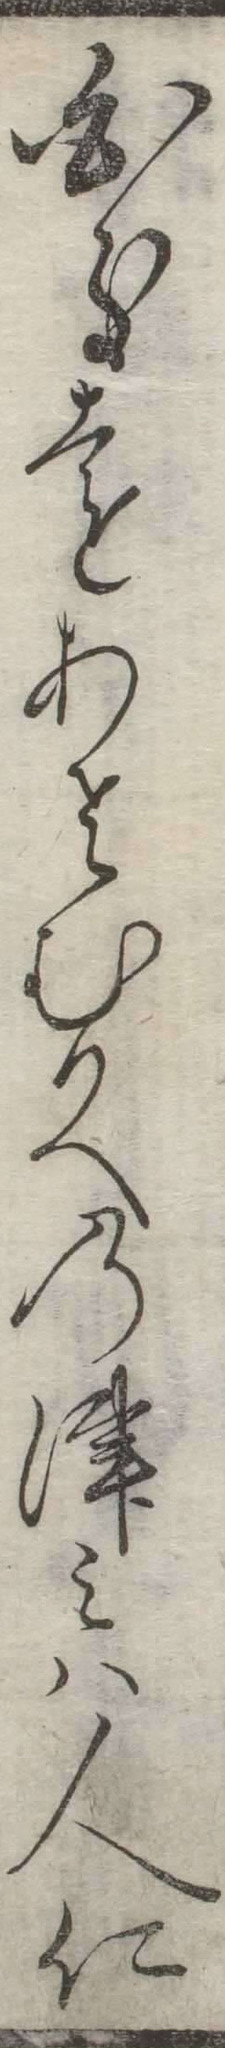白きをあさむくのつみは人に

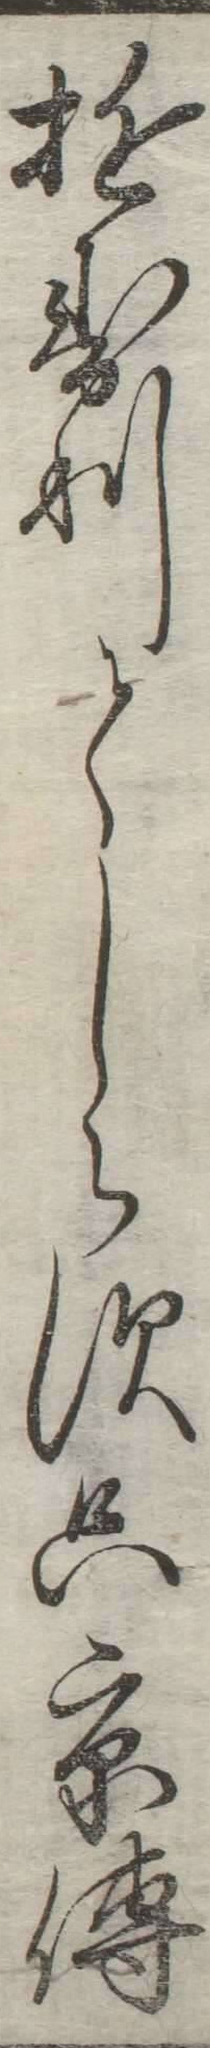ゆすりてしらす只京伝
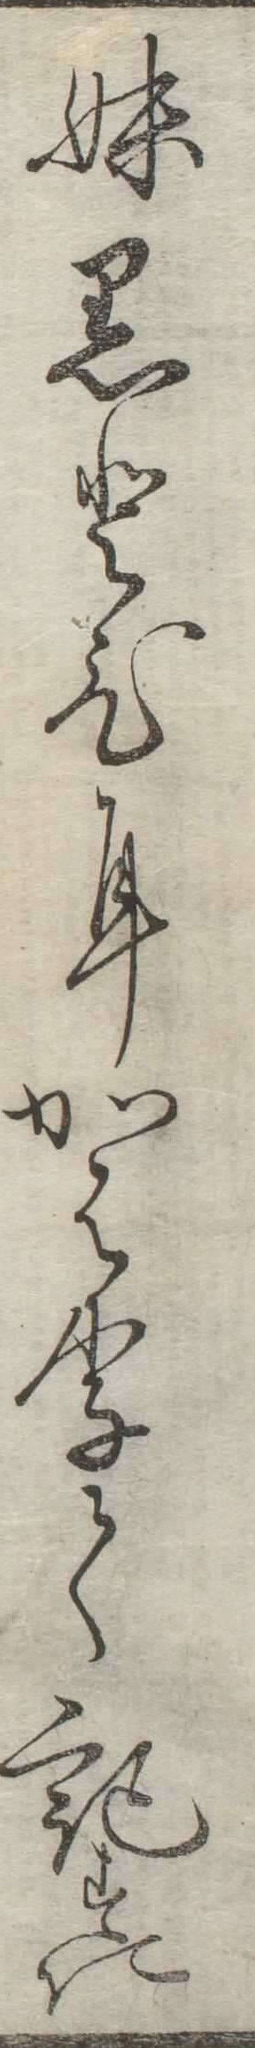妹黒とひにかはりて記すに
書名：たなくひあわせ
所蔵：国文学研究資料館
